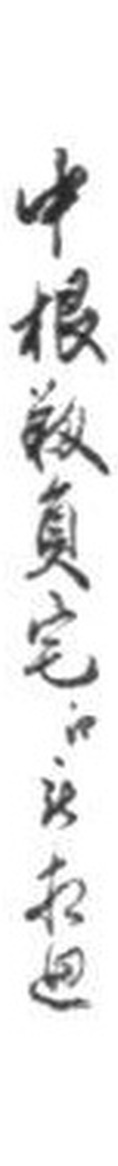中根靱負宅江被相廻
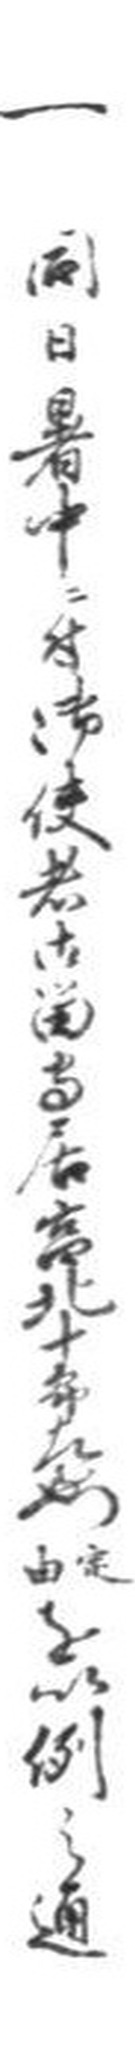一同日暑中ニ付御使者御留守居宮北十郎左衛門定由を以例之通
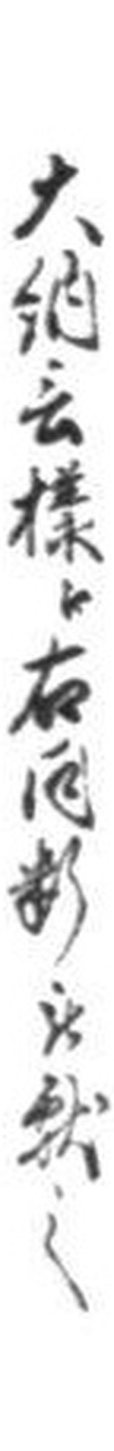大納言様江右同断被献之
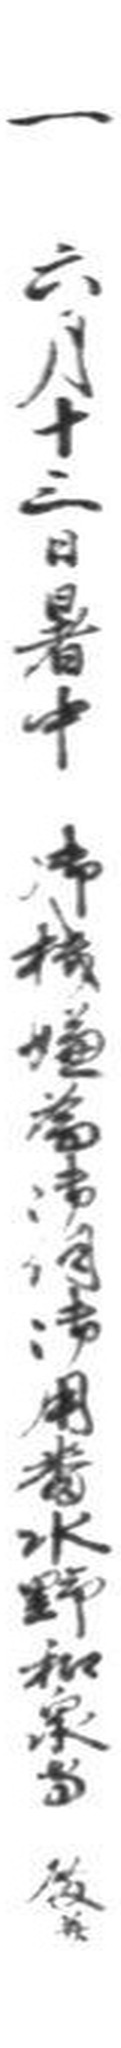一六月十三日暑中御機嫌為御伺御用番水野和泉守殿幷
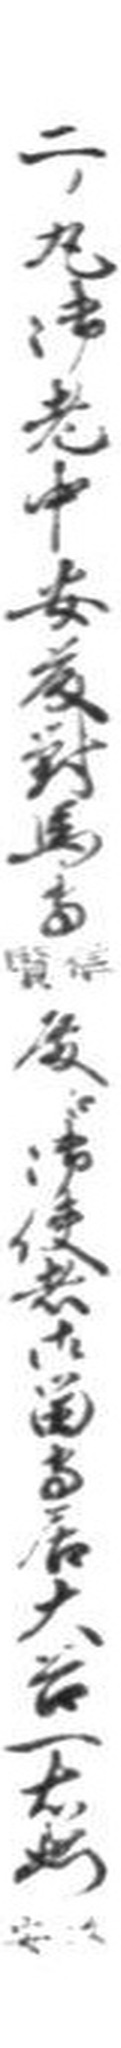二ノ丸御老中安藤対馬守信賢殿江御使者御留守居大谷一右衛門次安
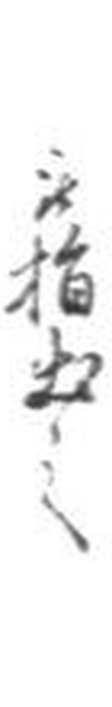被指出之
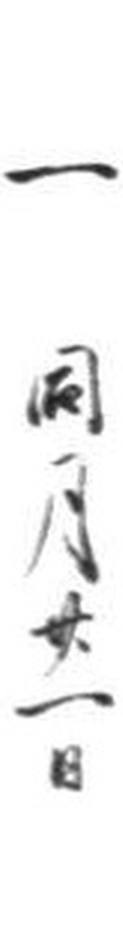一同月廿一日
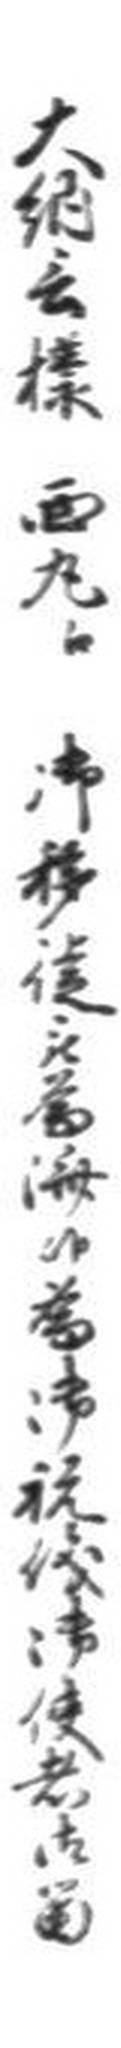大納言様西丸江御移徙被為済候為御祝儀御使者御留
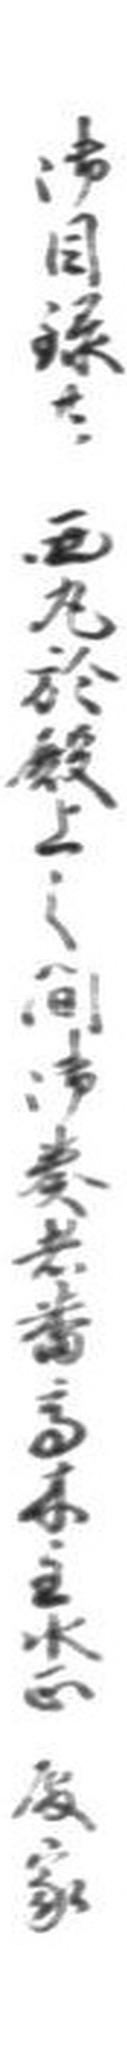御目録共西丸於殿上之間御奏者番高木主水正殿家
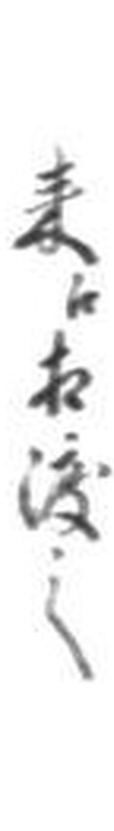来江相渡之
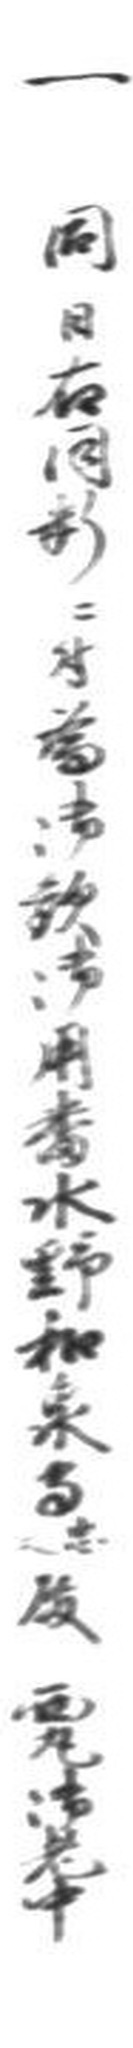一同日右同断ニ付為御歓御用番水野和泉守忠之殿西丸御老中
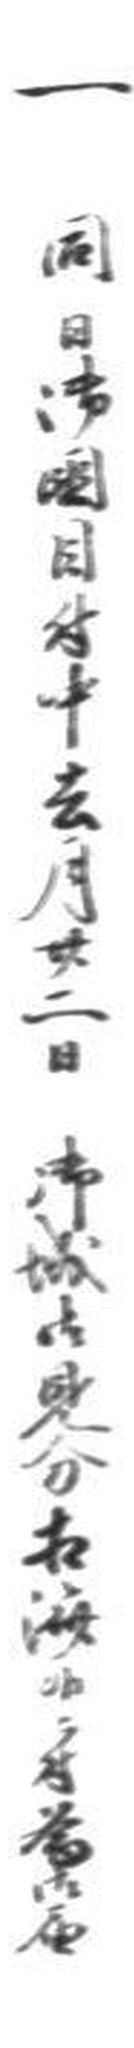一同日御国目付中去月廿二日御城御見分相済候ニ付為御届
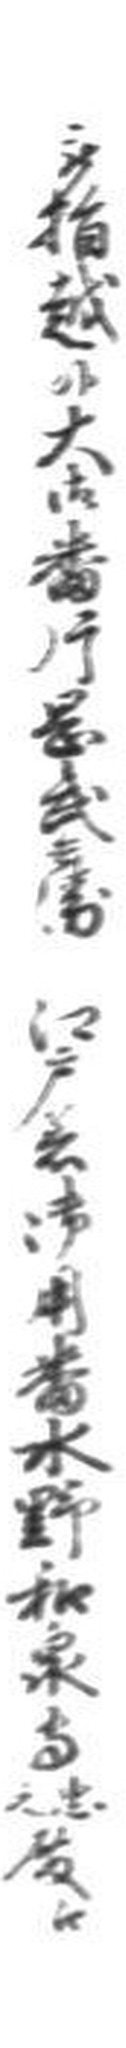被指越候大御番片岡武兵衛江戸着御用番水野和泉守忠之殿江

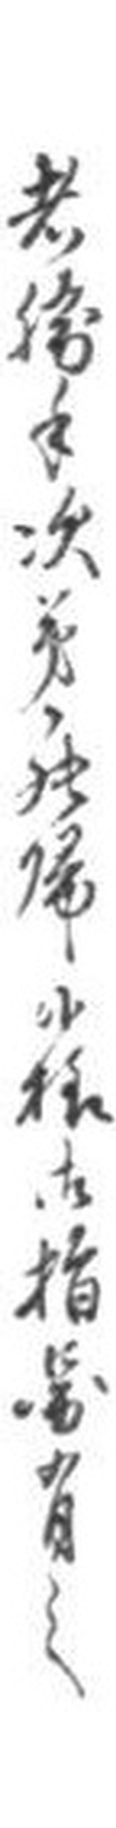者勝手次第罷帰候様御指図有之
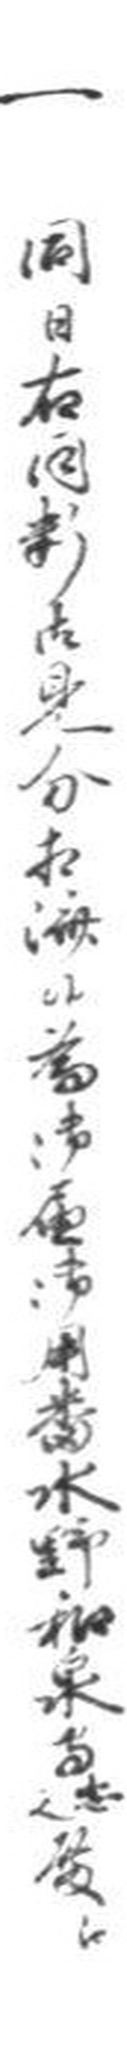一同日右同断御見分相済候為御届御用番水野和泉守忠之殿江
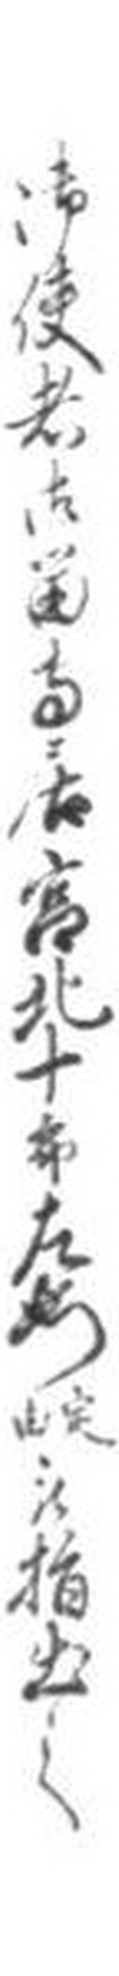御使者御留守居宮北十郎左衛門定由被指出之
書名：家譜 三十九 宗矩公 享保十年
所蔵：福井県文書館 Fukui Prefectural Archives
